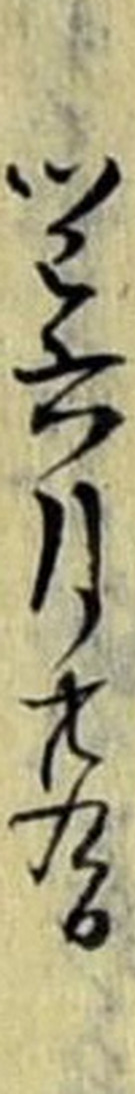閏六月廿九日
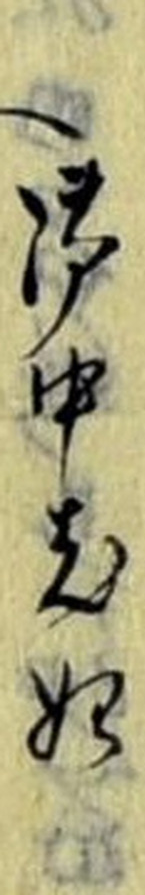御中老始

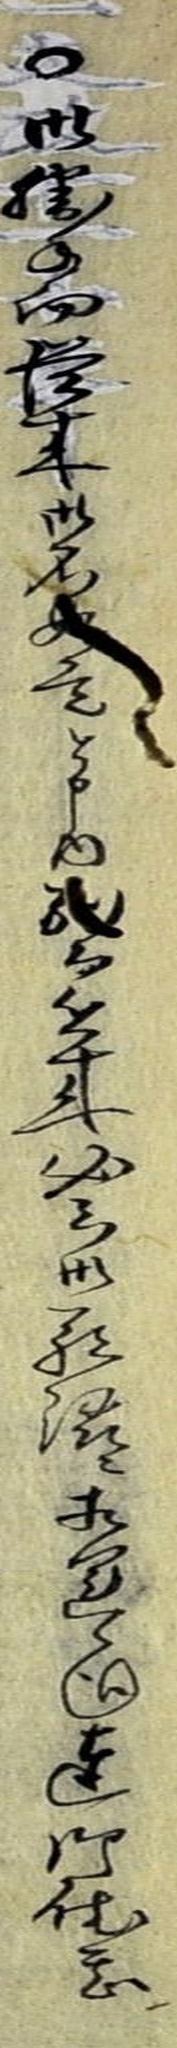○御勝手向従来御不如意と申内別而近来必至御難渋ニ相運候趣達御聴甚
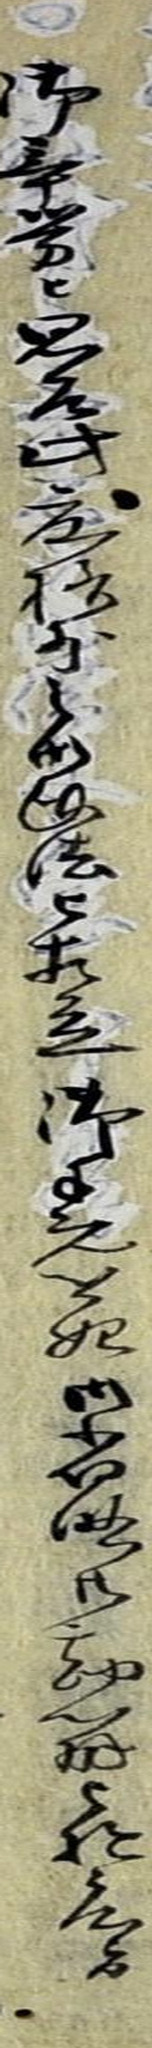御辛労と思召此度格外之御手法被相立御手元を始御省略御勘弁被遊度旨
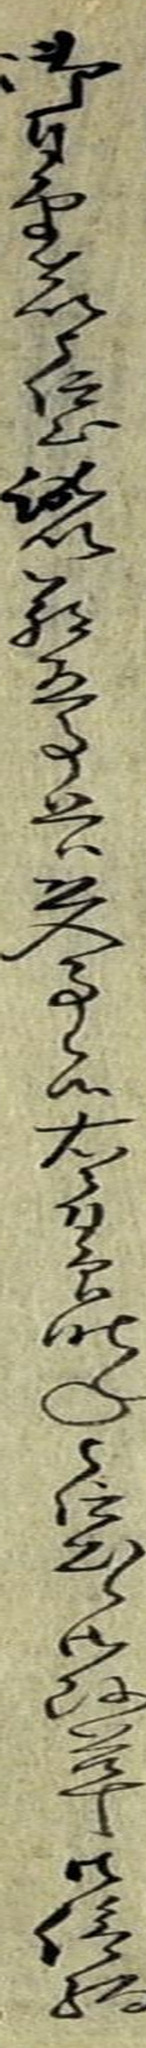御自筆を以被仰出誠以難有事且ハ恐入事ニ候右ニ付而ハ昨年被仰出候御改革御倹約
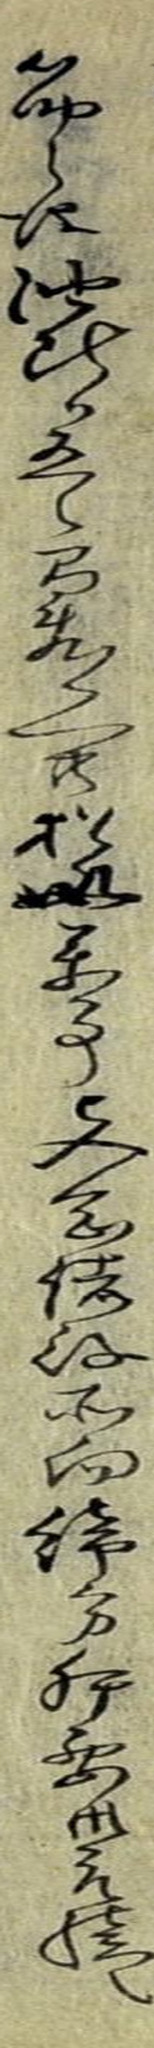筋之儀油断ハ有之間敷候へ共猶以万事被入念諸役所向締方肝要御取続之
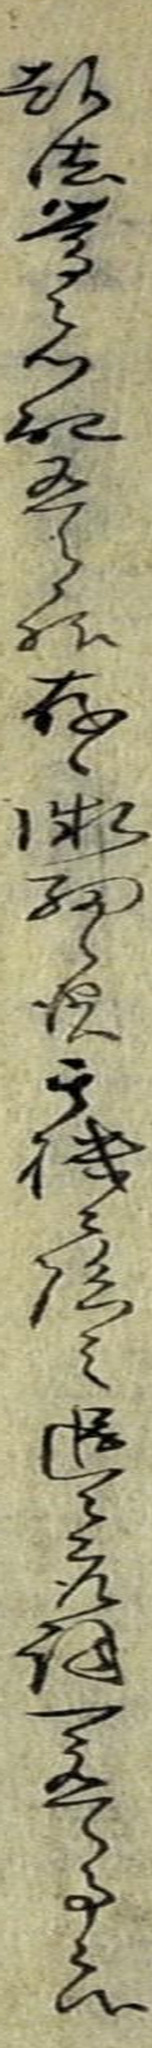趣法篤と心配有之候様存候微細之儀ハ其機ニ臨ミ追々取調可有之ニ候
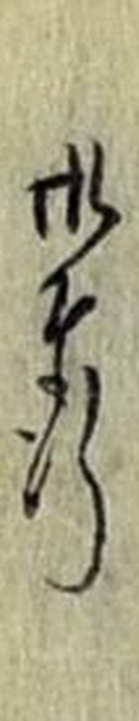御奉行
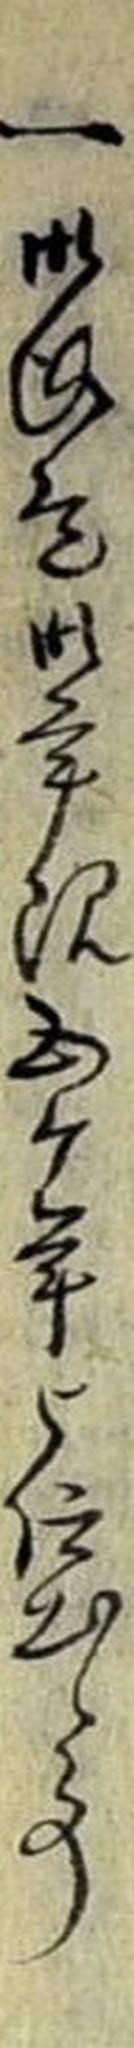一御趣意御年限五ケ年被仰出候事
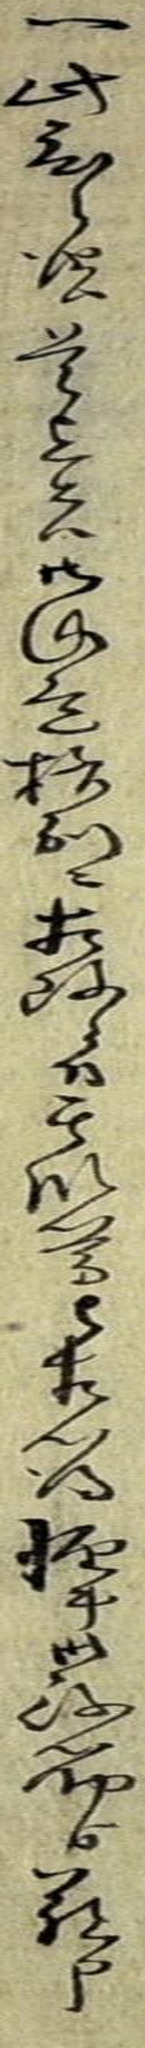一此度之儀ハ是迄ニハ御趣意格別ニ相改ニ付其段篤与相心得軽キ御役筋ゟ難申
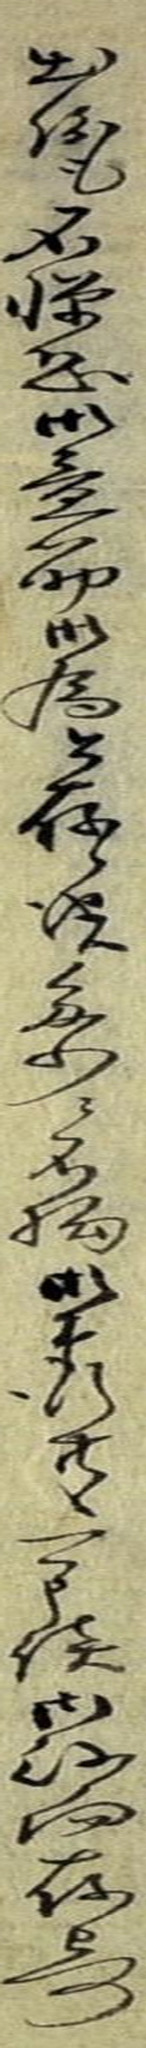出儀も不憚恐御益筋御為と存候儀ハ多少ニ不拘御奉行共へ可申談御役向存寄
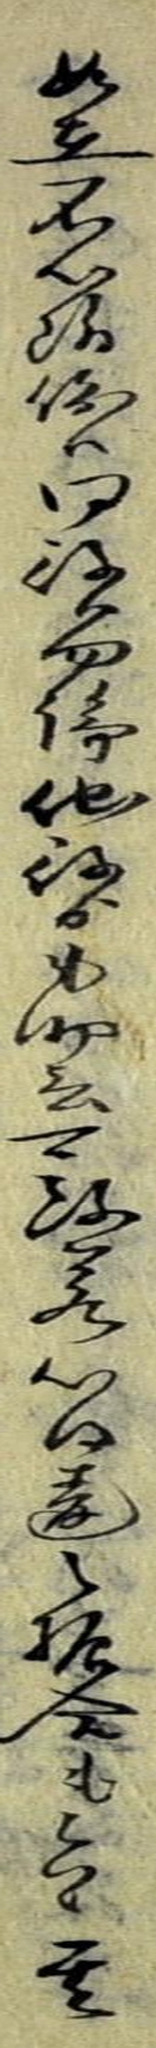如在不心附儀ハ同役ハ勿論他役ゟも助言可致若心得違之振合も候ハヽ其
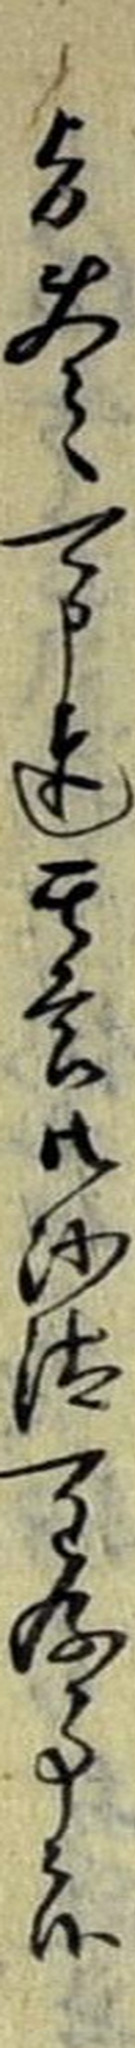旨夫々可申達其節御沙汰可被及事ニ候
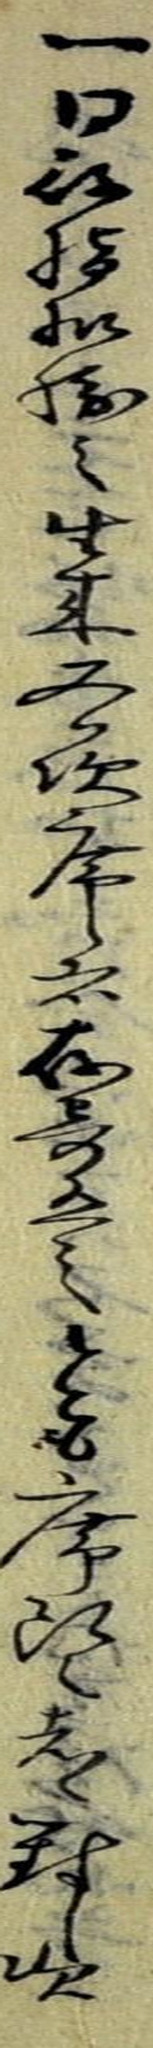一同役指扣勝之生来又ハ次席之者存寄有之候とも席頭之者へ対し次
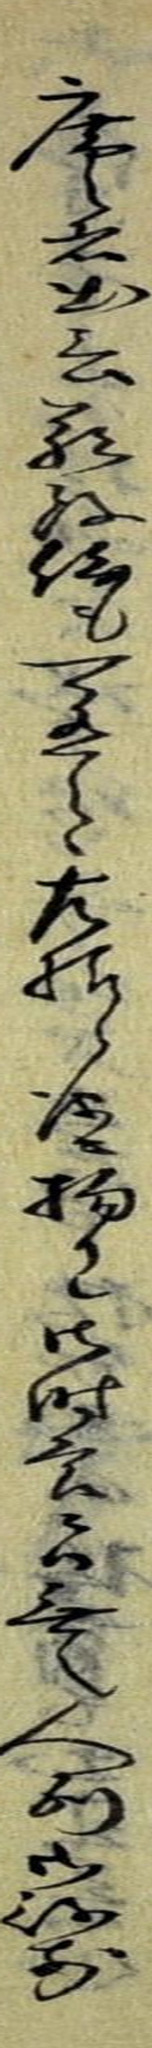席之者出言難致儀も可有之候左様之儀ニ掛り拘り候御時節ニハ無之人別御役前
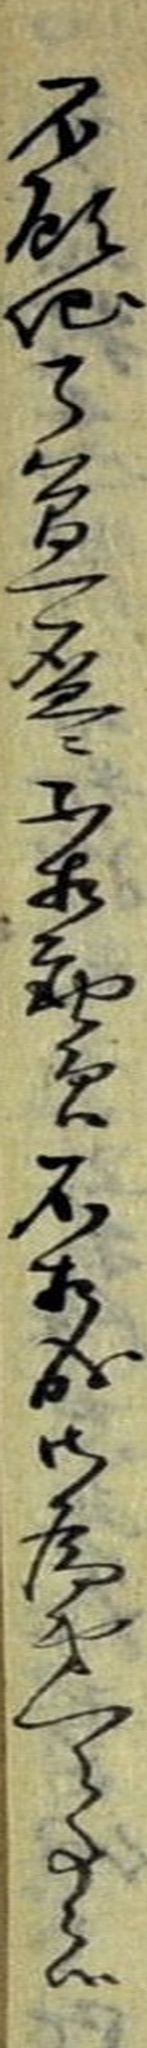不顧任了簡一盃ニ不相勤候而ハ不相成御為第一之事ニ候
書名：命令之部 五
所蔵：福井県文書館 Fukui Prefectural Archives
